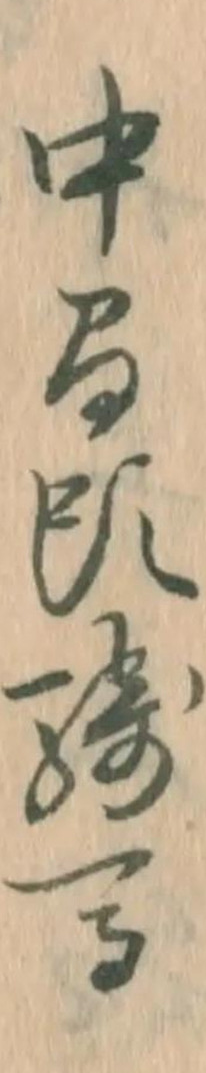中間頭騎馬
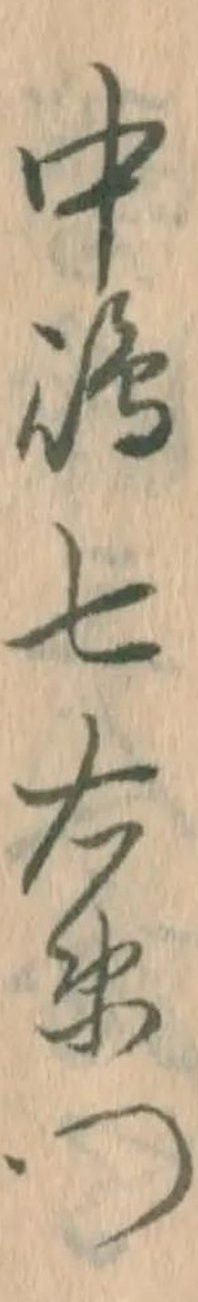中島七右衛門
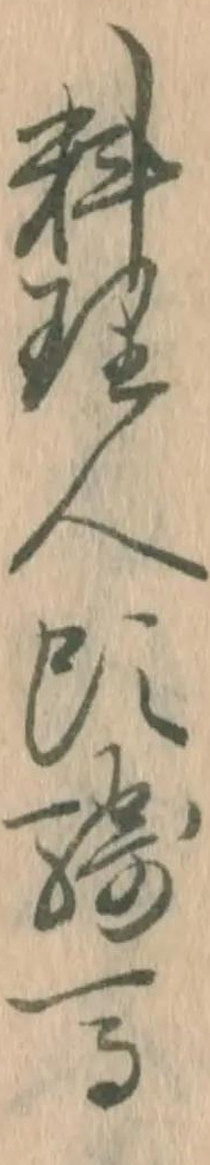料理人頭騎馬
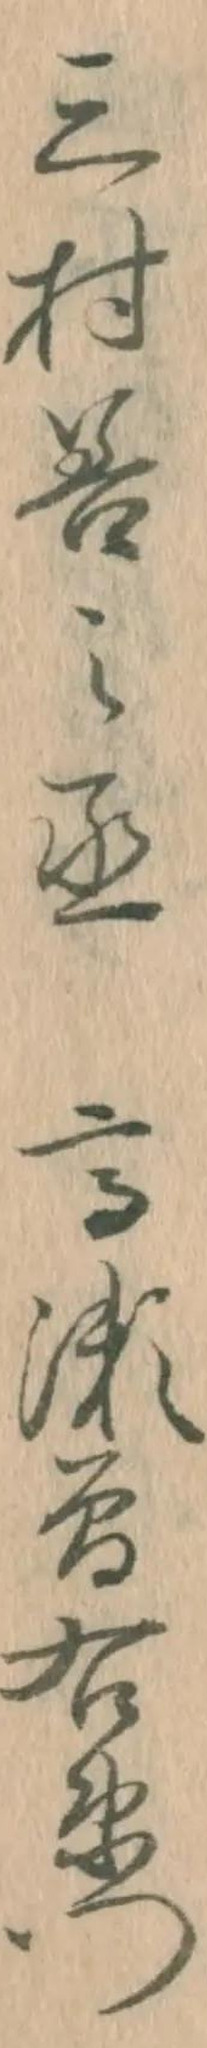三村善之丞高瀬曽右衛門
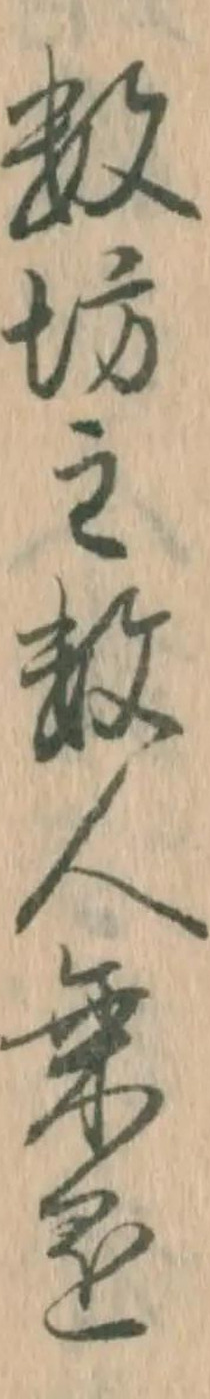数坊主数人乗懸
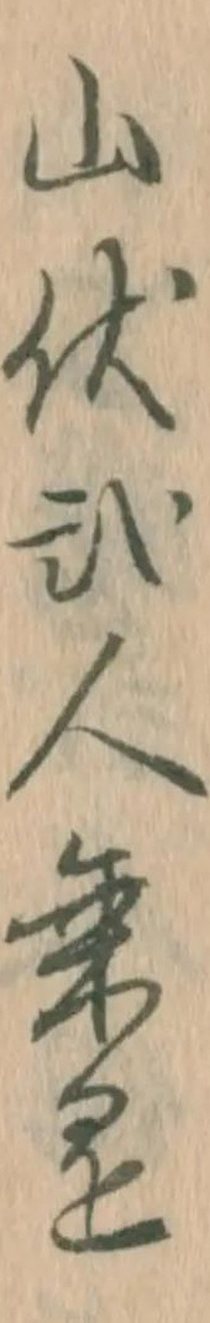山伏弐人乗懸
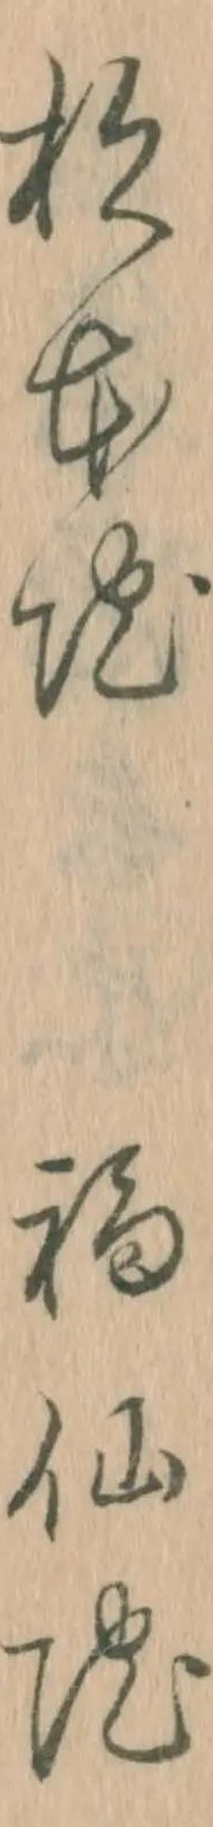杉本院福仙院
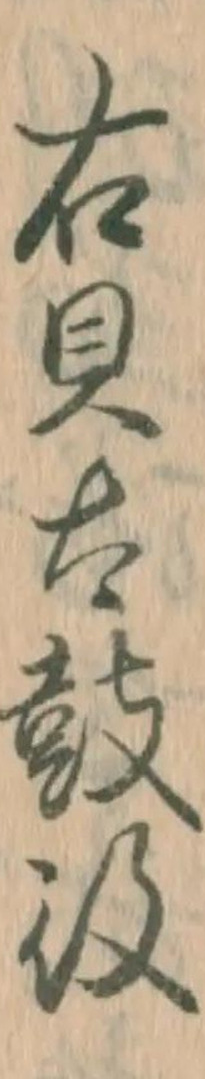右貝太鼓役
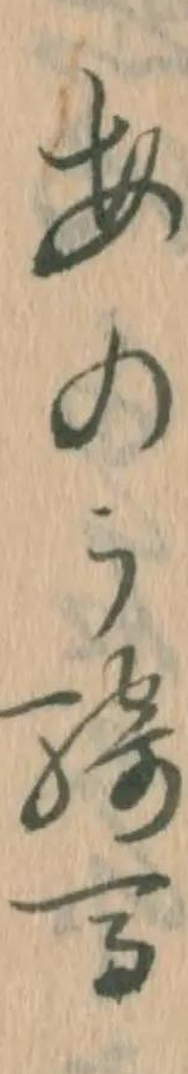あのう騎馬
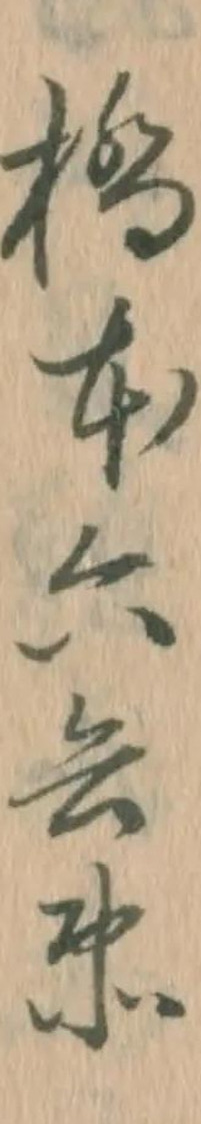橋本六兵衛
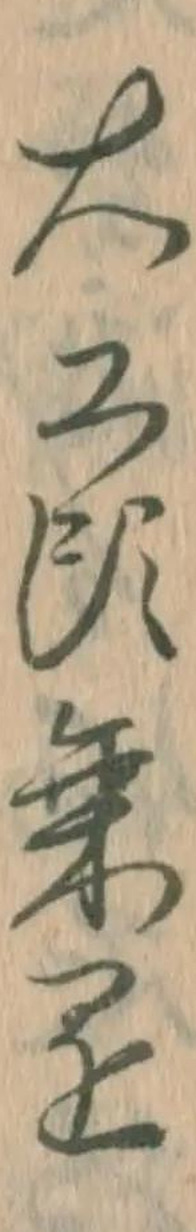大工頭乗懸
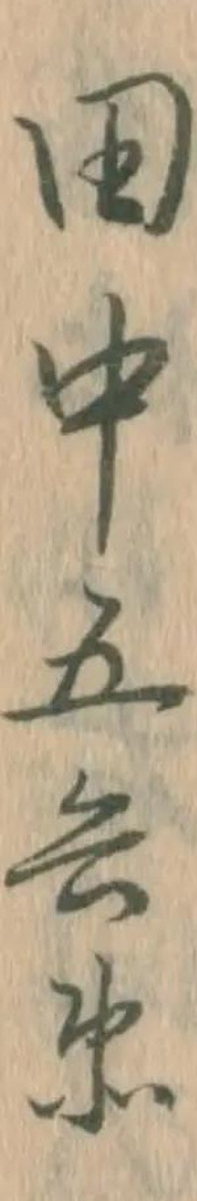田中五兵衛
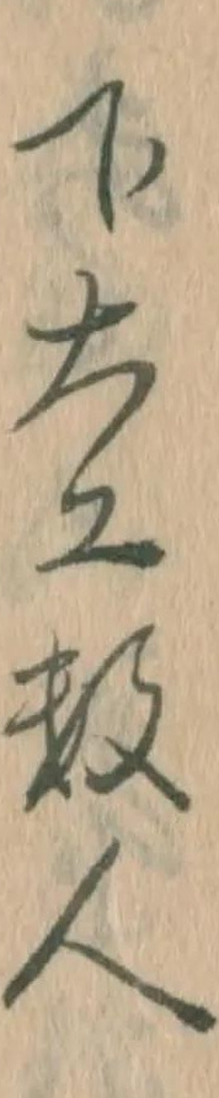下大工数人
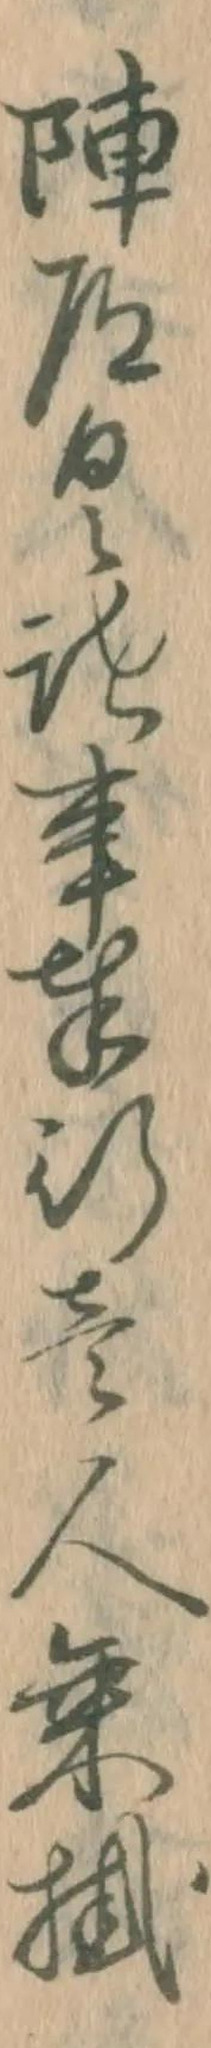陣道具之諸事奉行壱人乗掛
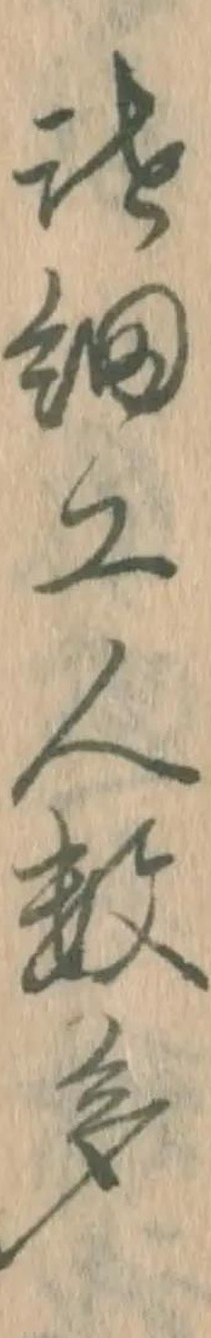諸細工人数多
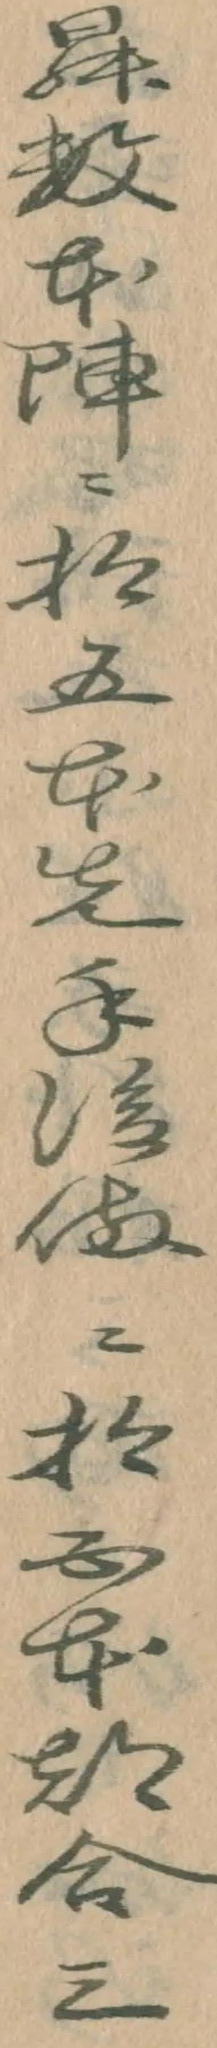昇数本陣に拾五本先手後備に拾五本都合三
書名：切支丹御退治記 49巻. [6]
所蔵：国立国会図書館 National Diet Library, JAPAN
